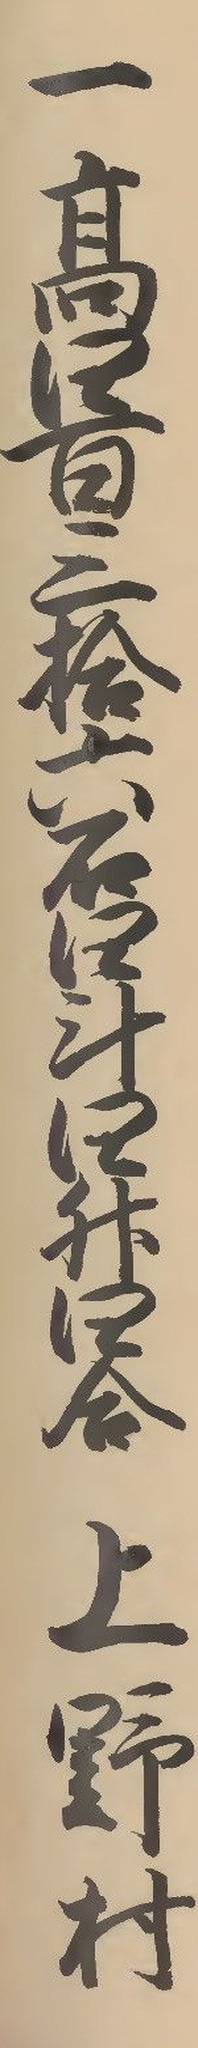一髙四百三拾六石四斗四升四合上野村
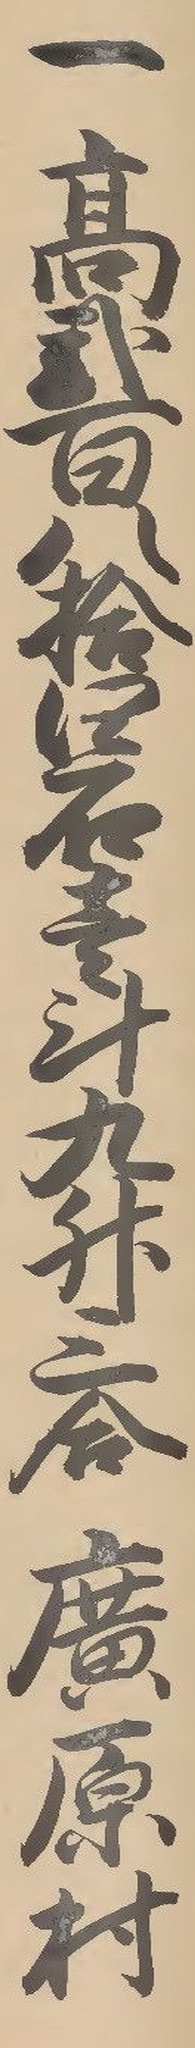一髙弐百八拾四石壱斗九升三合廣原村
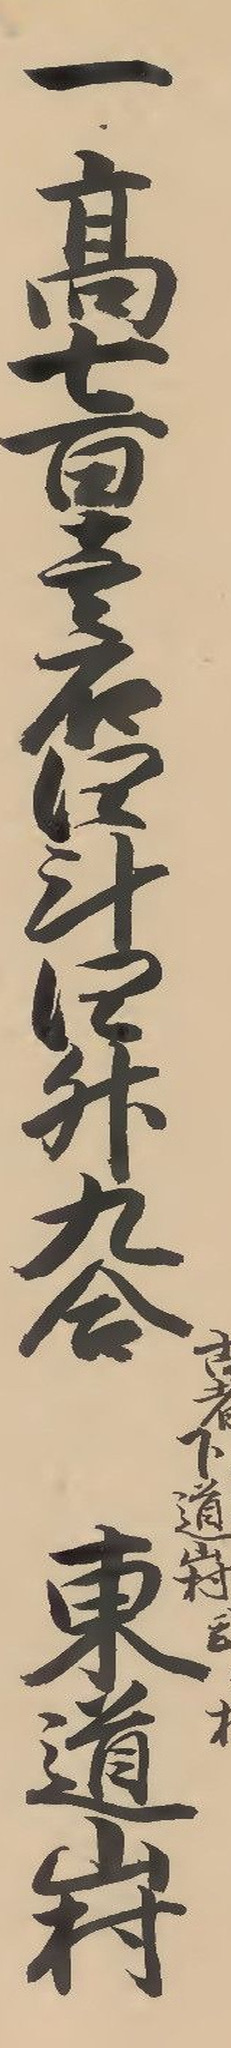一髙七百壱石四斗四升九合東道山村
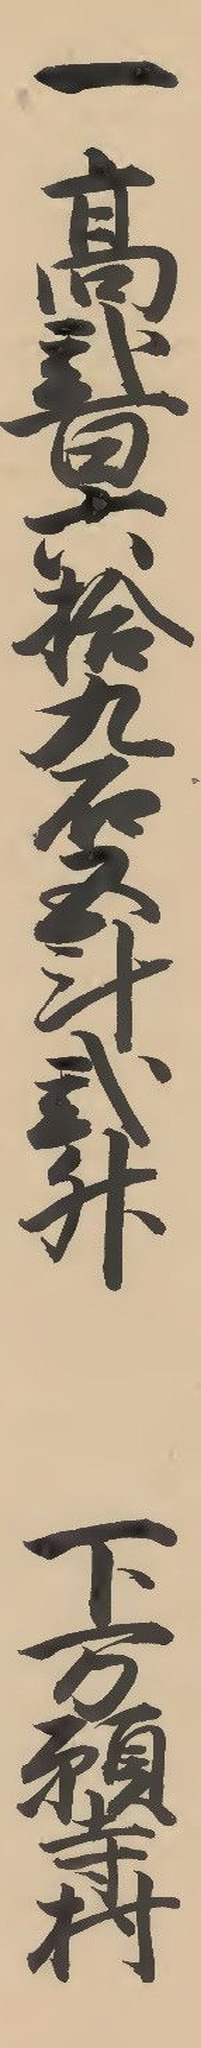一髙弐百六拾九石五斗弐升下万願寺村
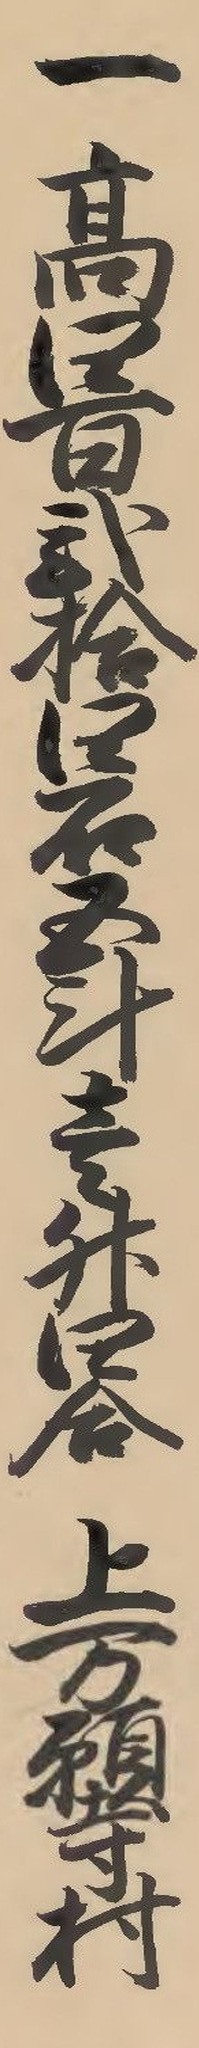一髙四百弐拾四石五斗壱升四合上万願寺村

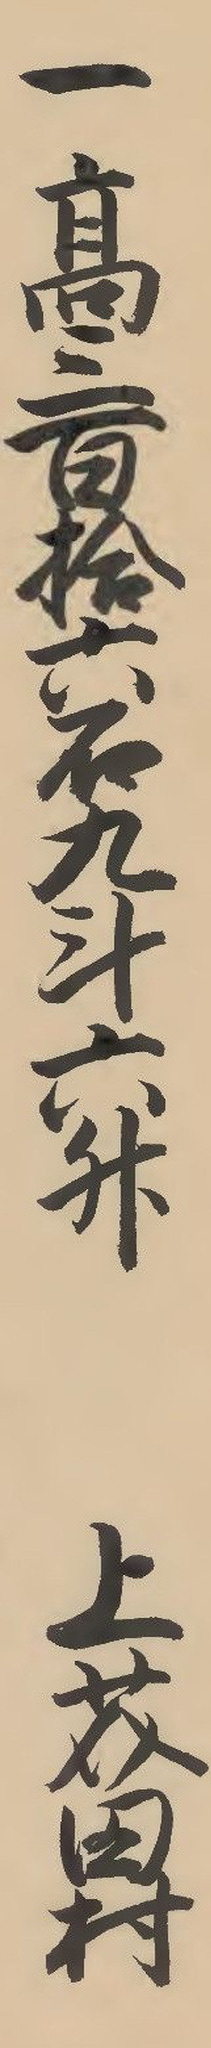一髙三百拾六石九斗六升上芥田村
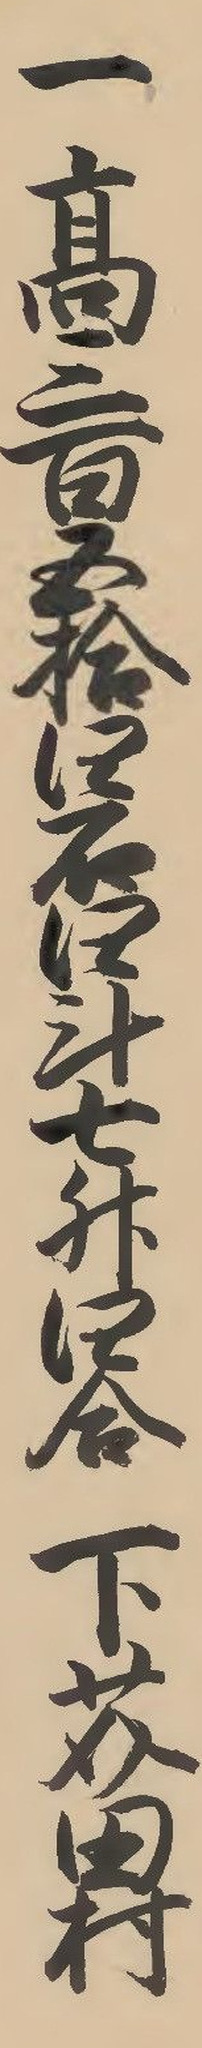一髙三百五拾四石四斗七升四合下芥田村
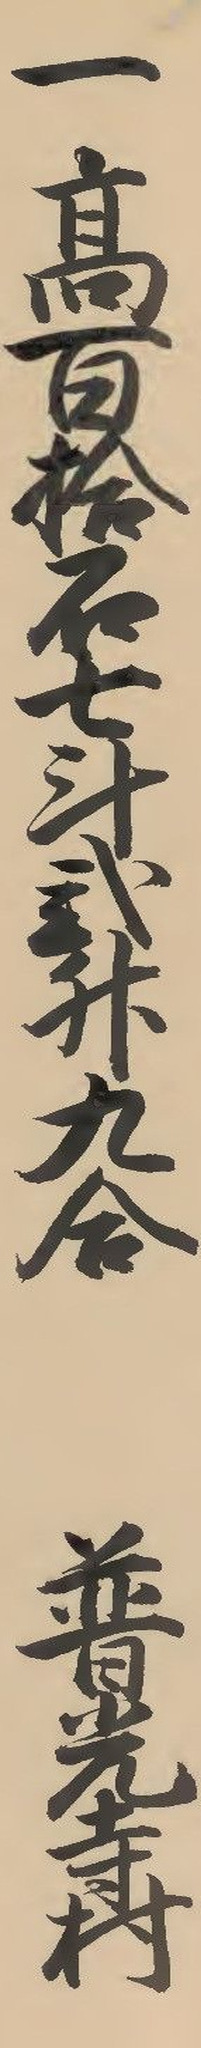一髙百拾石七斗弐升九合普光寺村
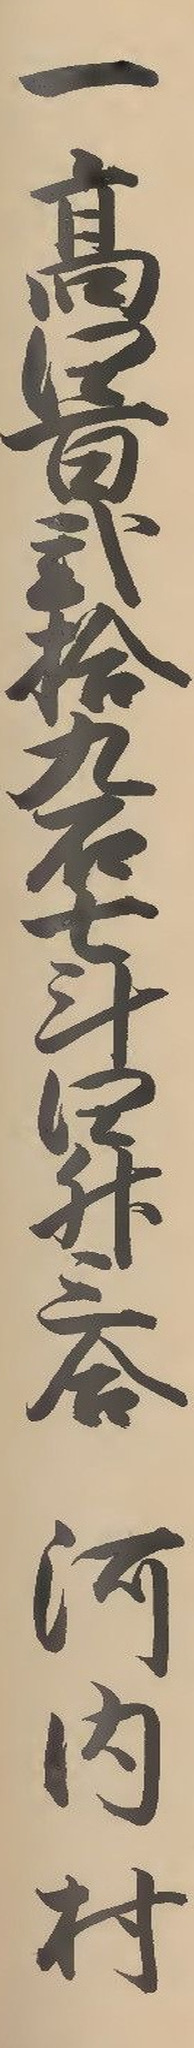一髙四百弐拾九石七斗四升三合河内村
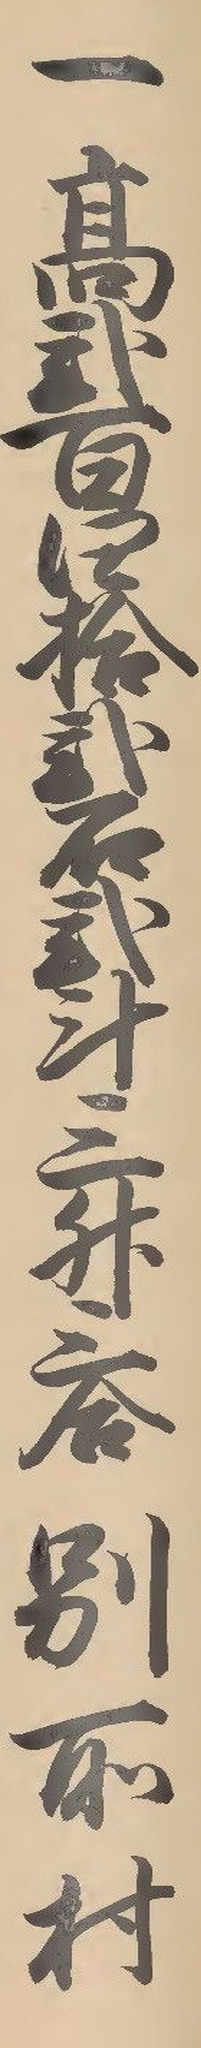一髙弐百四拾弐石弐斗三升三合別所村
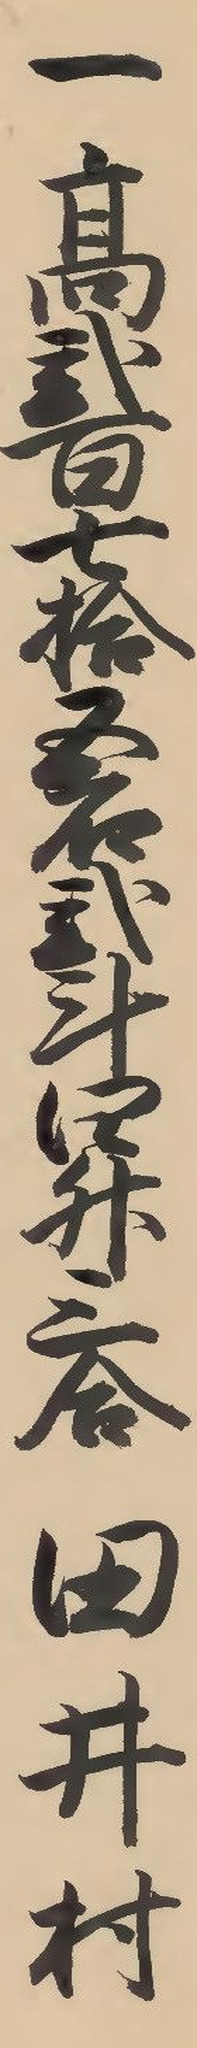一髙二百七拾五石弐斗四升三合田井村
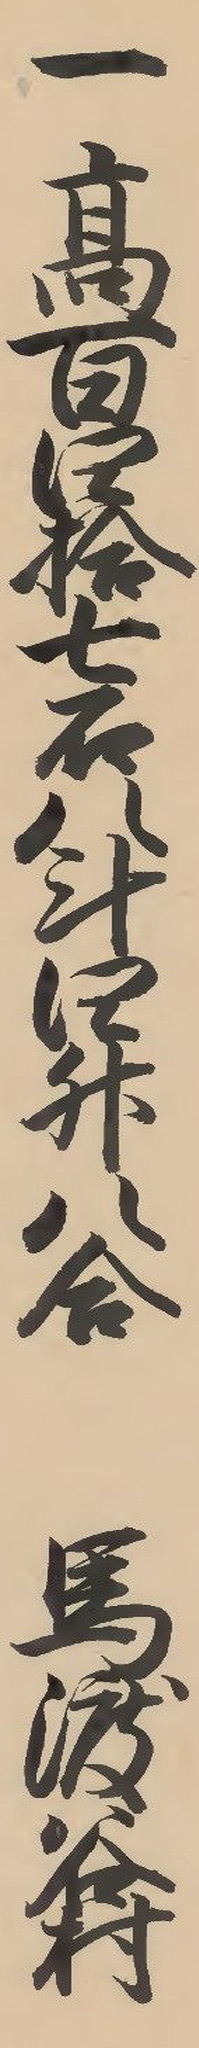一髙百四拾七石八斗四升八合馬渡谷村
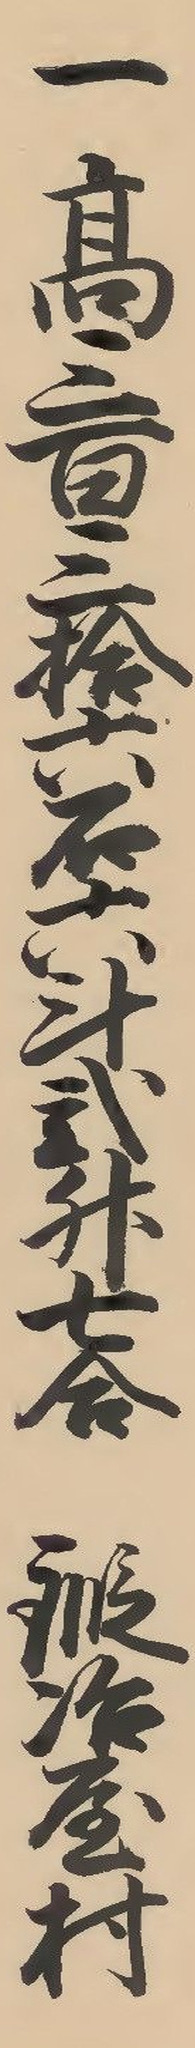一髙三百三拾六石六斗弐升七合鍛冶屋村

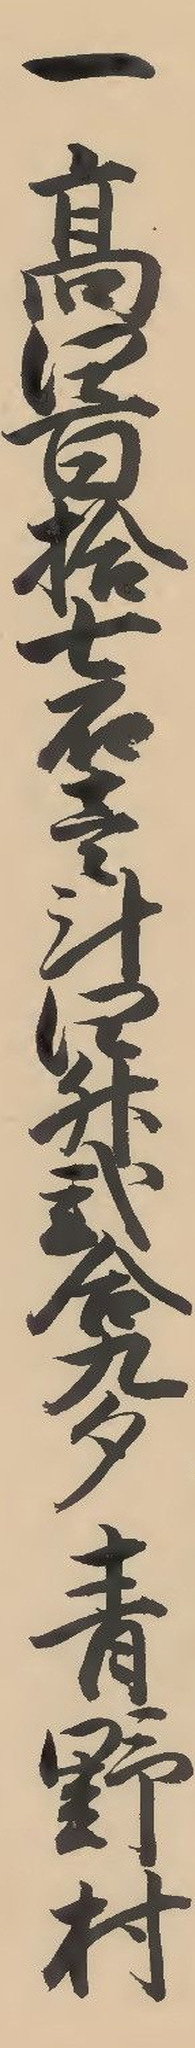一髙四百拾七石壱斗四升弐合九夕青野村
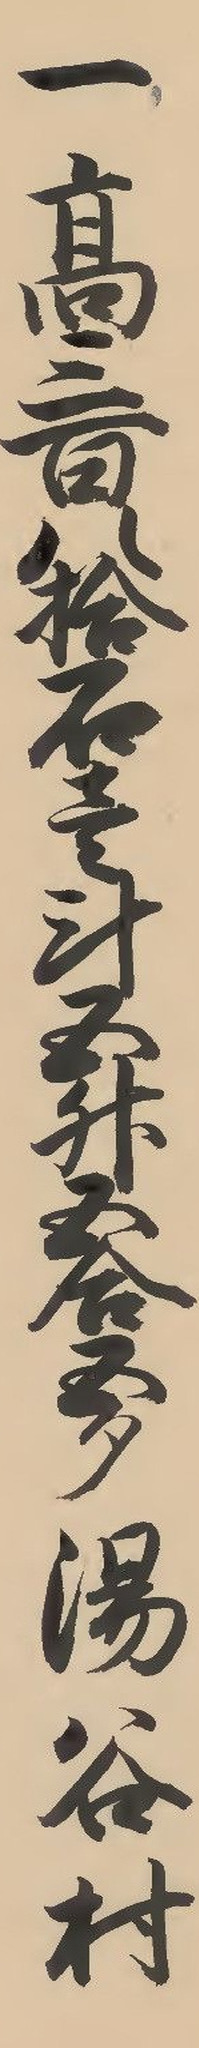一髙三百八拾石壱斗五升五合五夕湯谷村
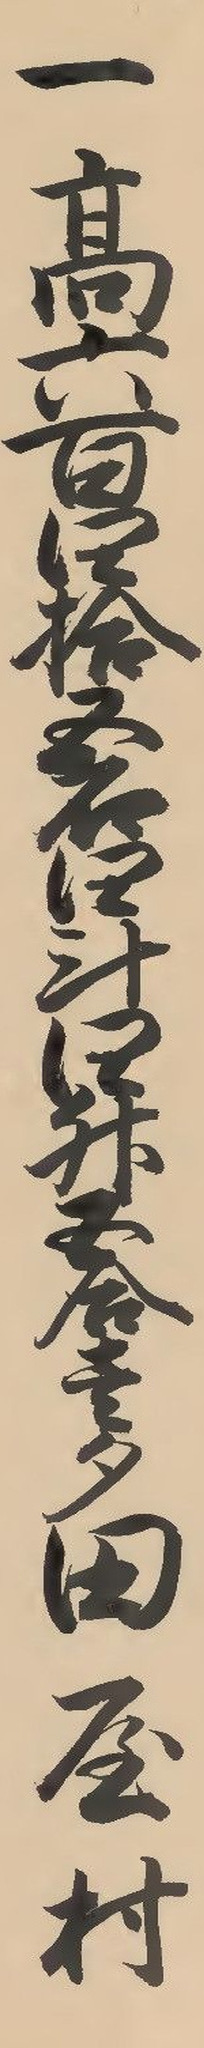一髙六百四拾五石四斗四升五合壱夕田屋村
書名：播磨国郷帳
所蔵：国立公文書館 National Archives of Japan
